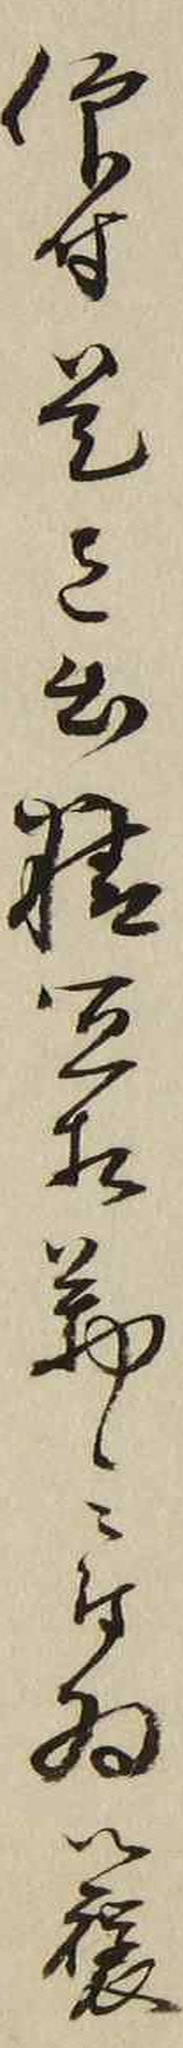仰付是迄出精宜相勤候ニ付為御褒
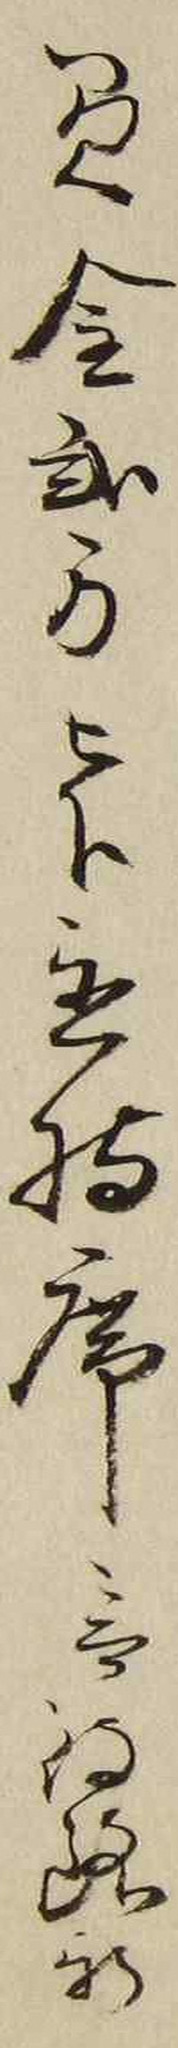美金弐分被下置持席ニ而役銘新

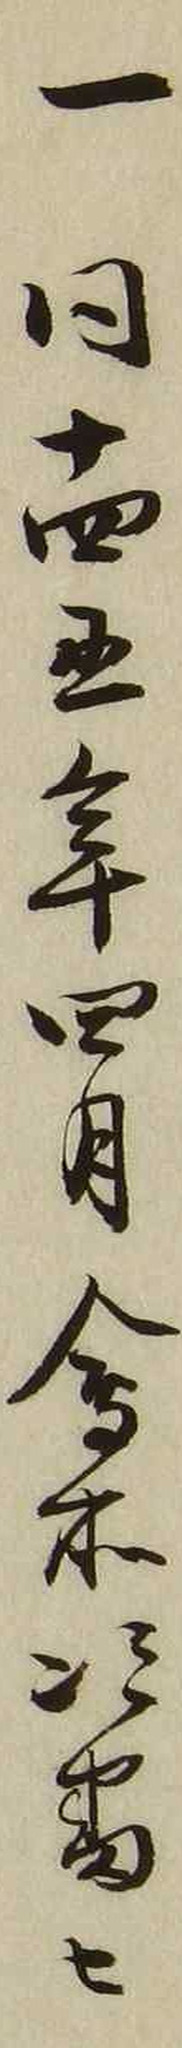一同十四丑年四月会所次番被
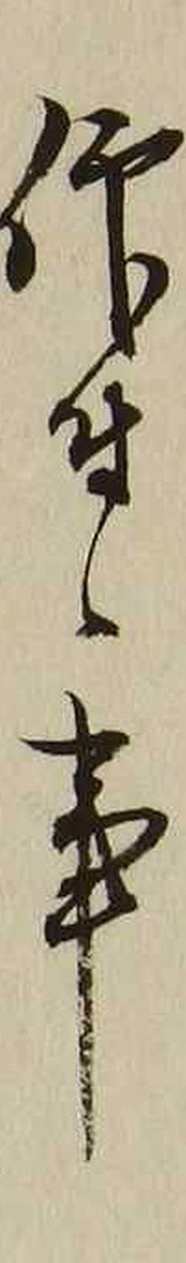仰付候事
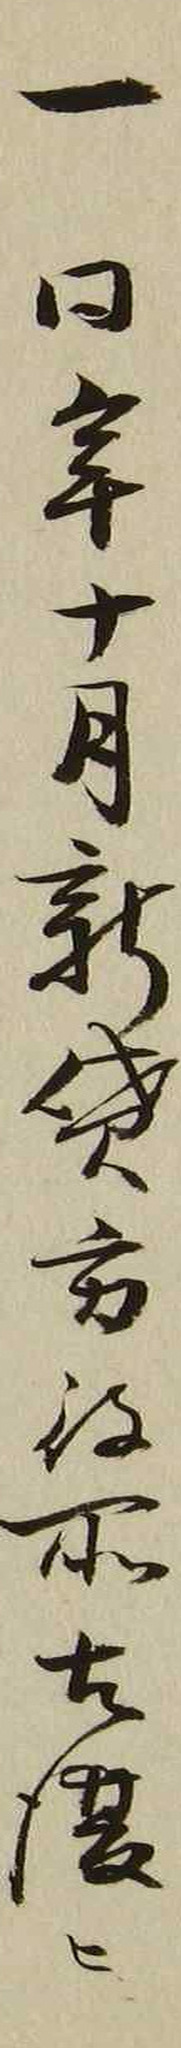一同年十月新貸方後役所相復被
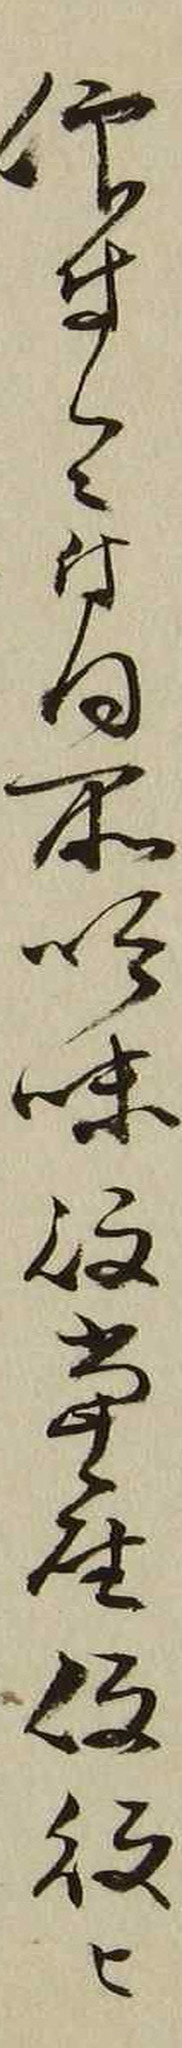仰付候ニ付同所吟味役当座仮役被
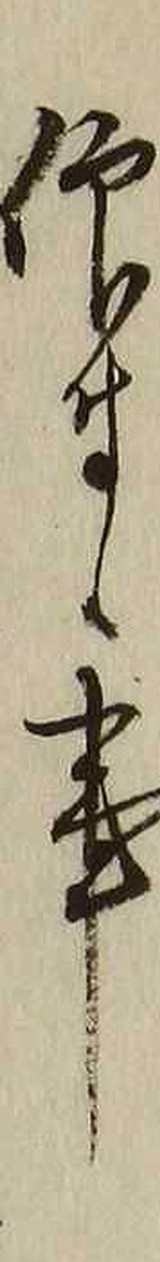仰付候事
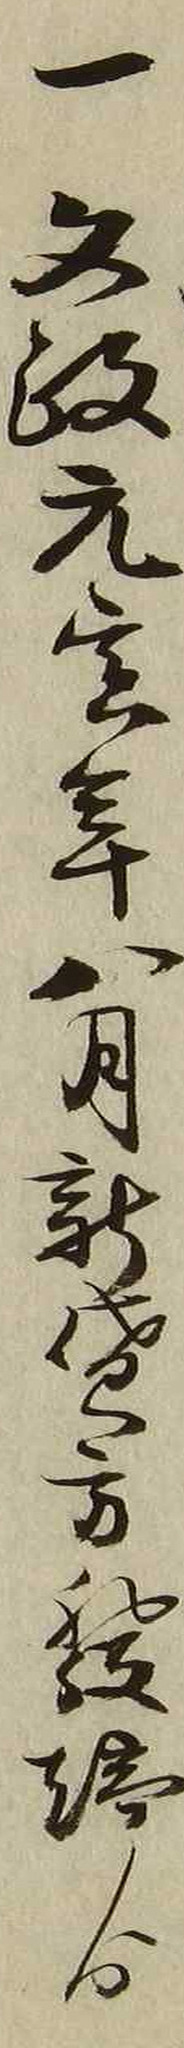一文政元寅年八月新貸方発端ゟ
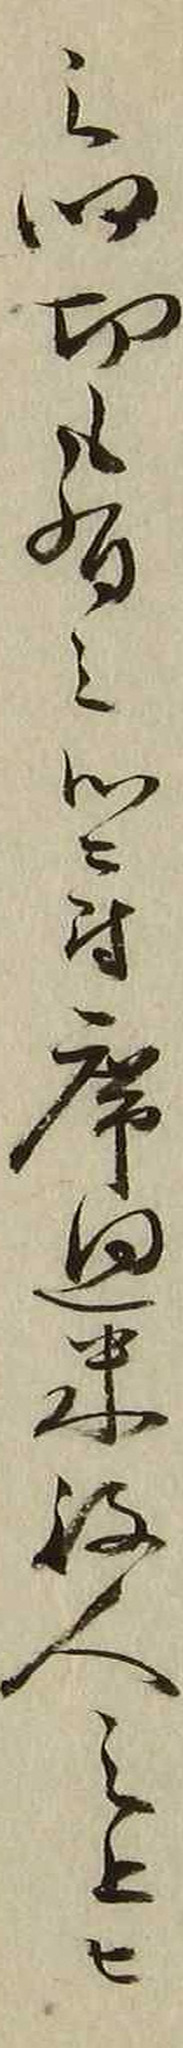之旧功も有之候ニ付席廻米役人之上被
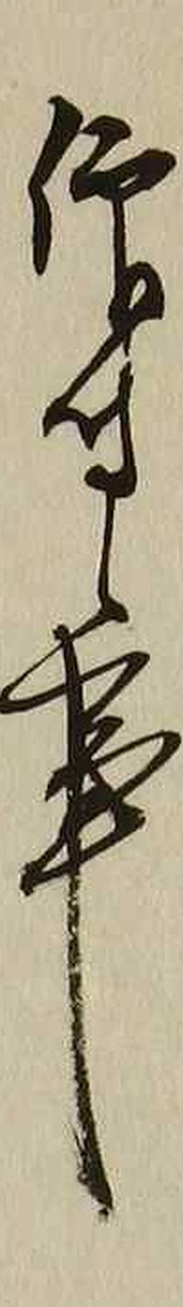仰付候事
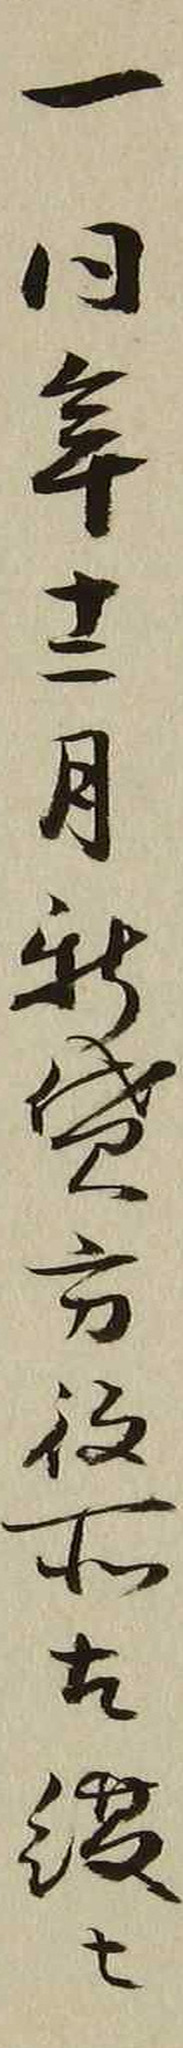一同年十二月新貸方役所相復被
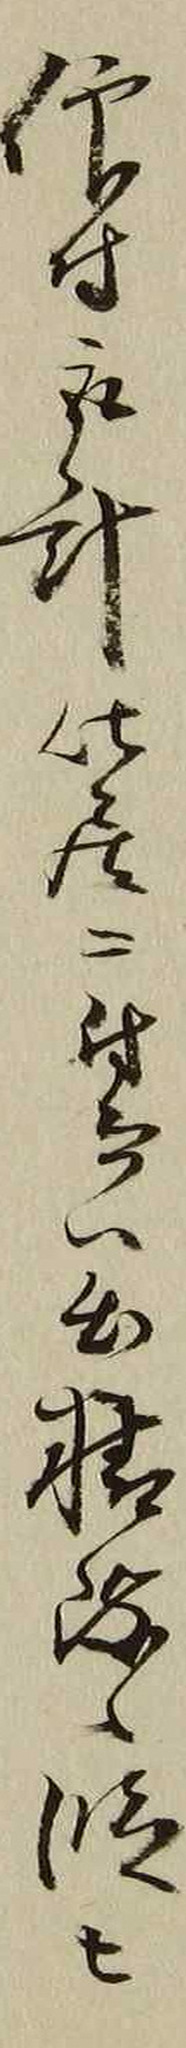仰付取計仕居ニ付而ハ出精致候段被
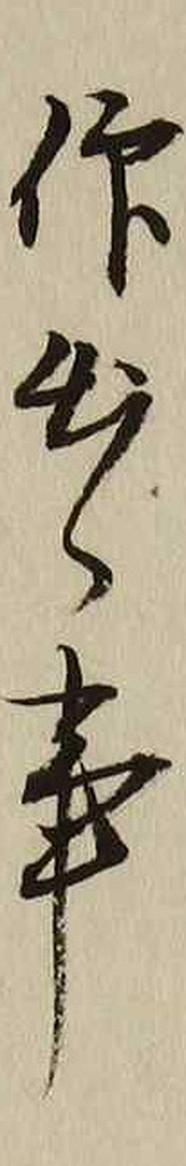仰出候事
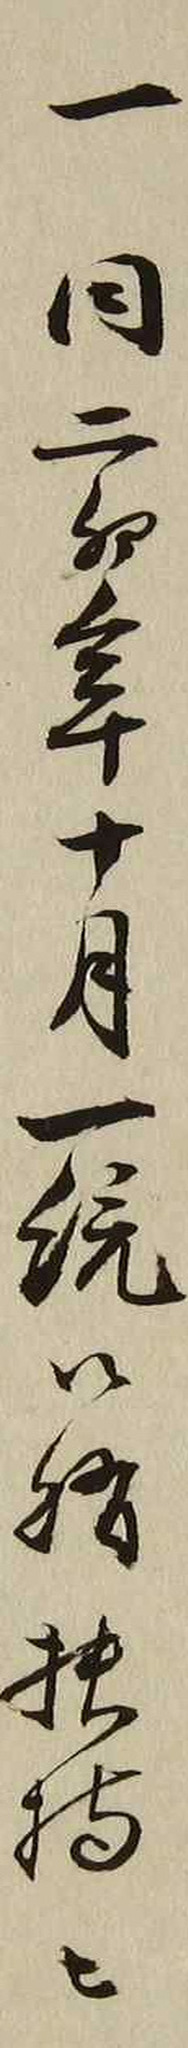一同二卯年十月一統御賄扶持被
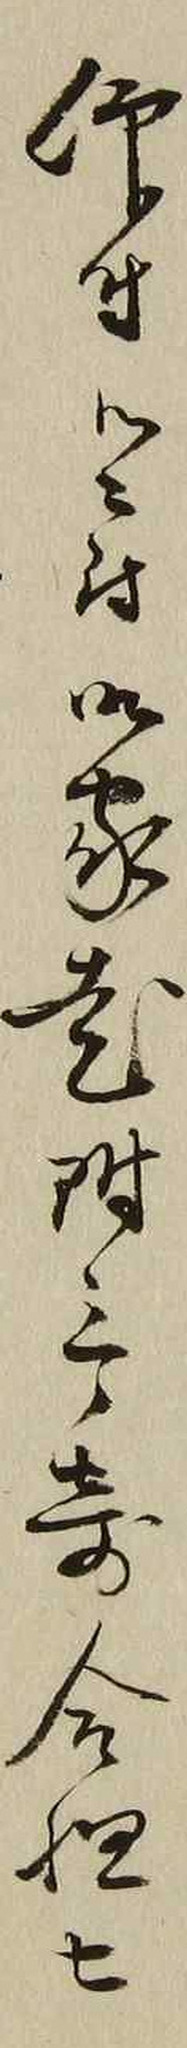仰付候ニ付御家老附三ノ寄合組被
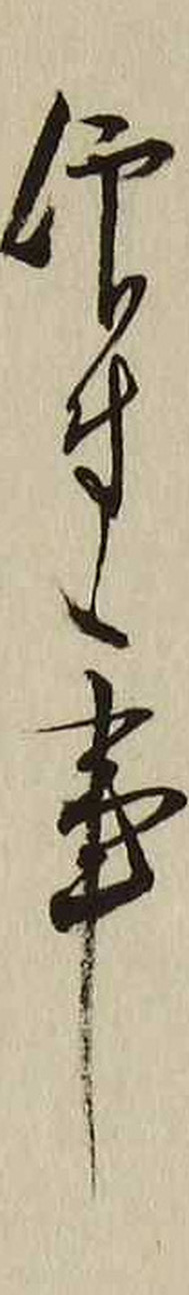仰付候事
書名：諸士系譜　巻之291　さ之部23
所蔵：会津若松市立会津図書館
